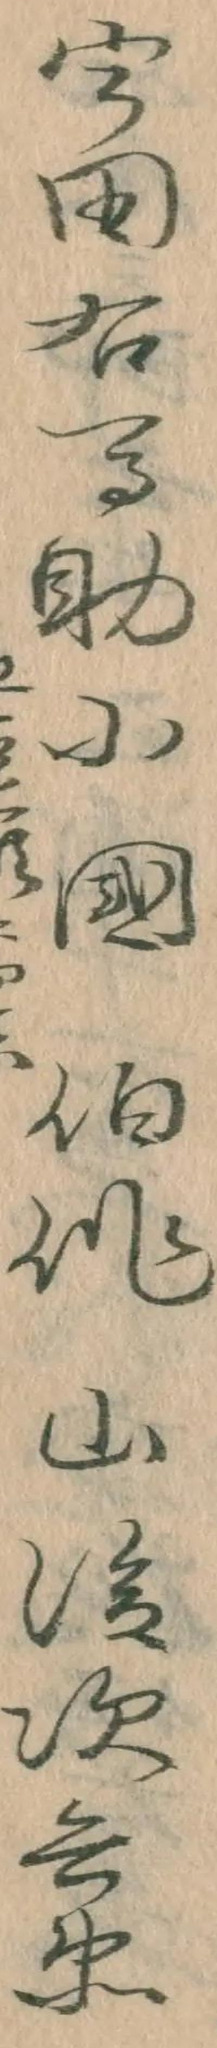宇田右馬介小国伯作山後次兵衛
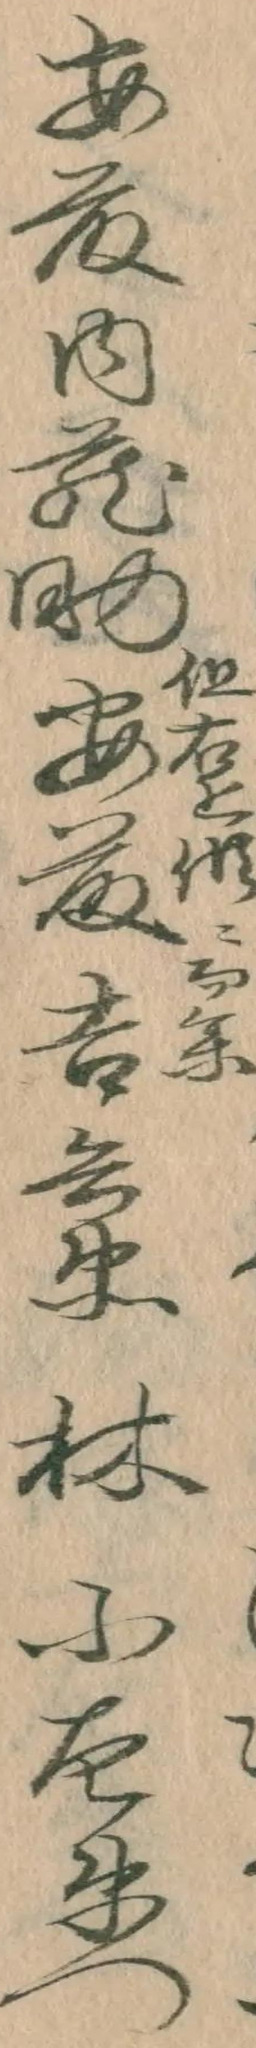安藤内蔵助安藤吉兵衛林小左衛門
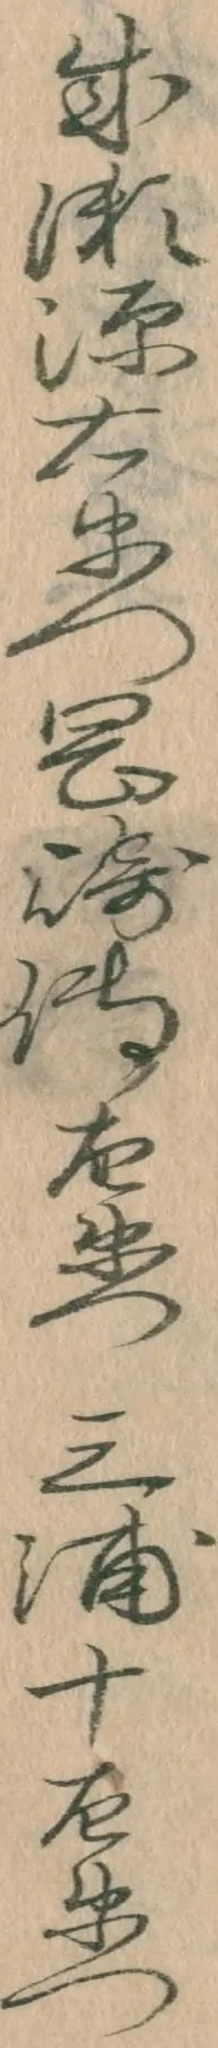成瀬源右衛門岡崎伝左衛門三浦十左衛門
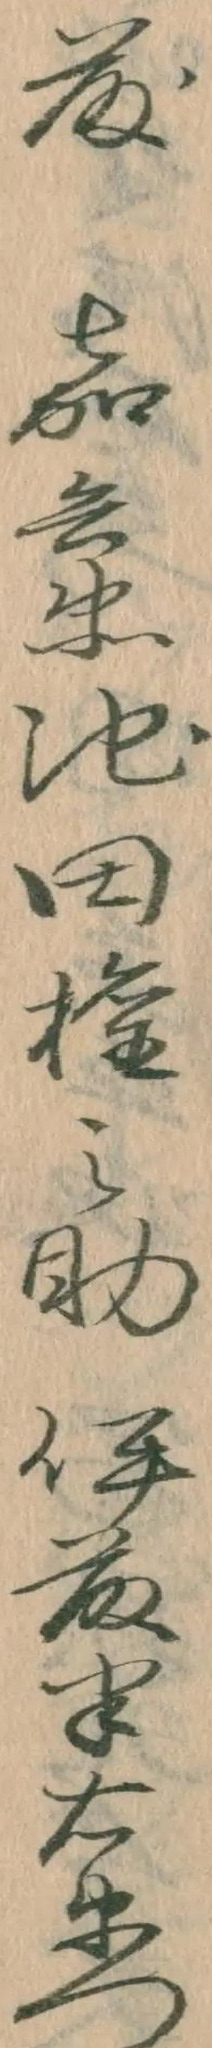藤嘉兵衛池田権之助伊藤半右衛門
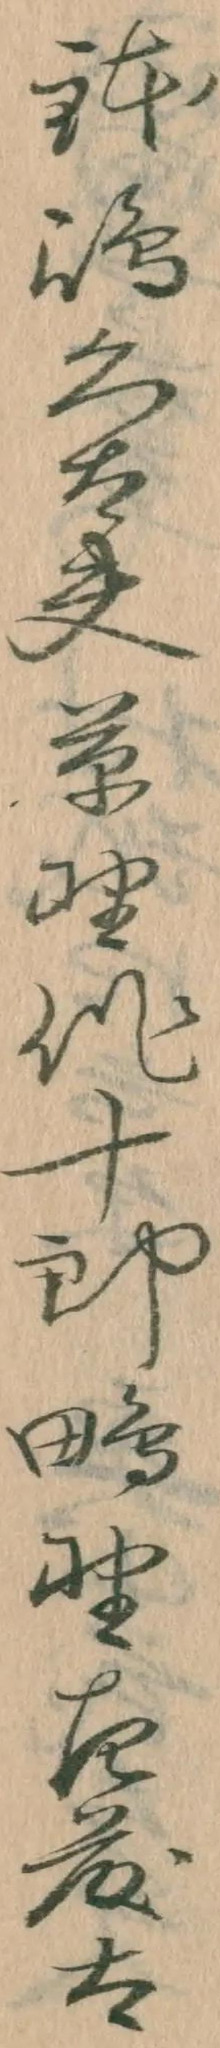鉢島九太夫草野作十郎鴫野佐藤太
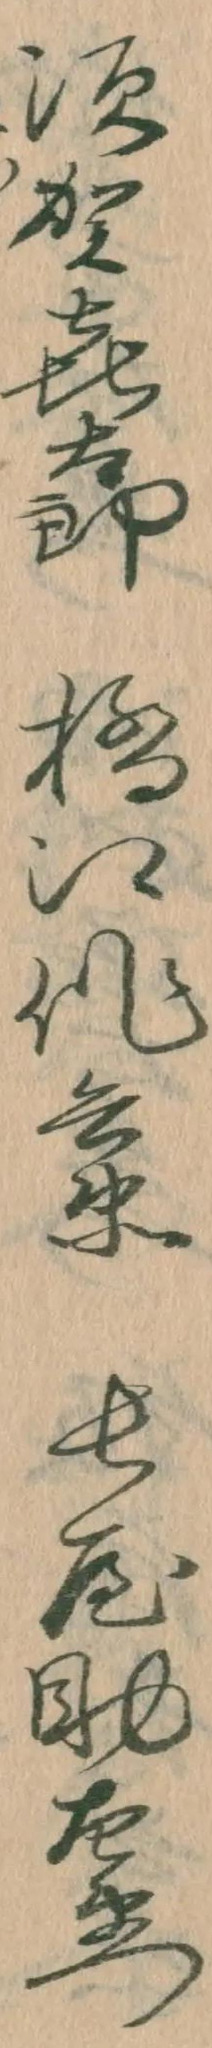須賀喜太郎橋江作兵衛長屋助左衛門
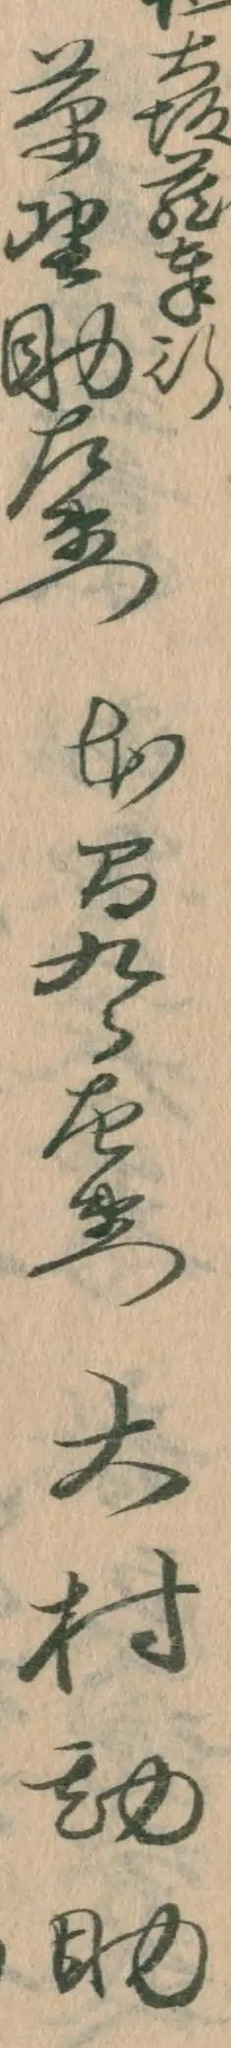草野助左衛門本間九郎左衛門大村勘助
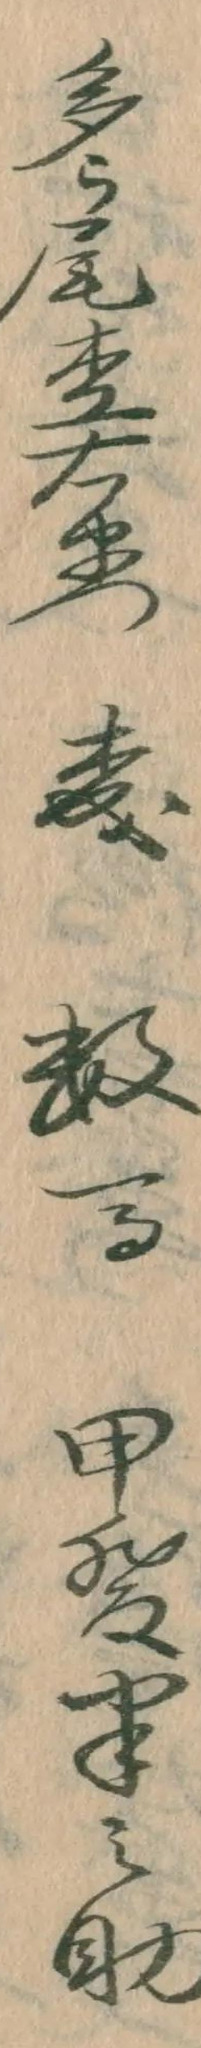多ら尾杢右衛門森数馬甲斐半之助
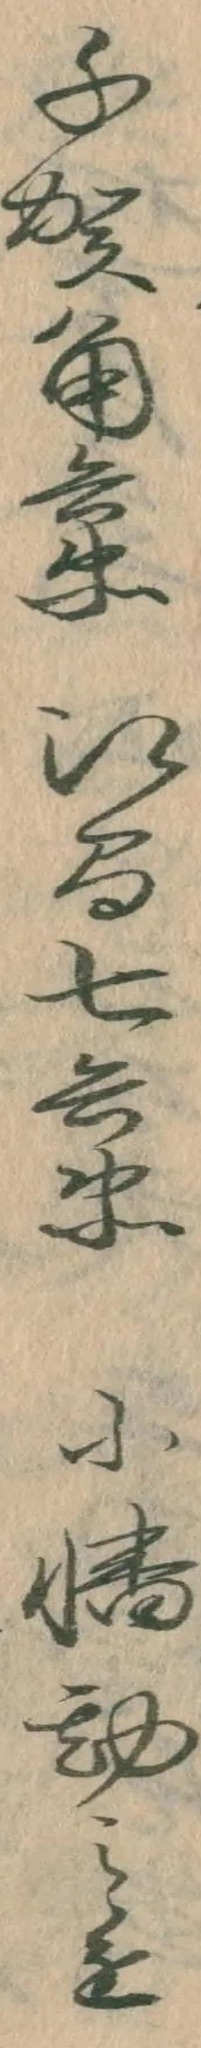千賀角兵衛江間七兵衛小幡勘之進
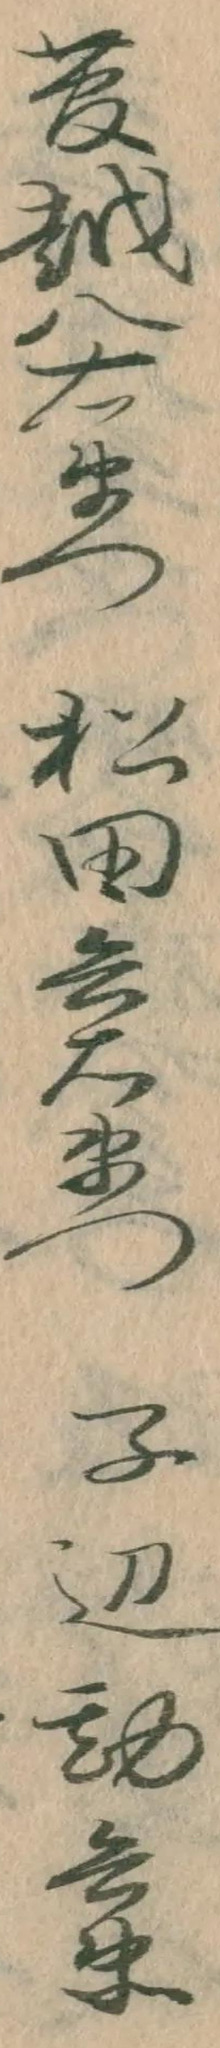菅越八右衛門松田兵右衛門子辺勘兵衛
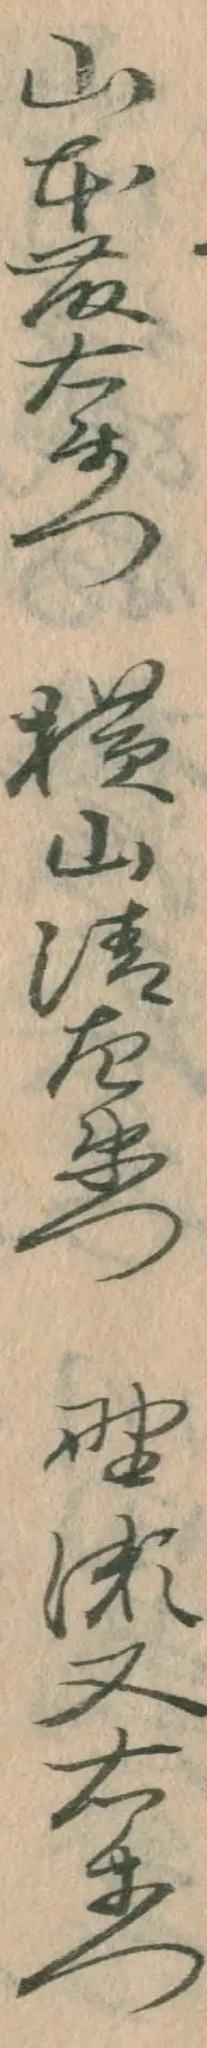山本藤右衛門横山清左衛門野瀬又右衛門
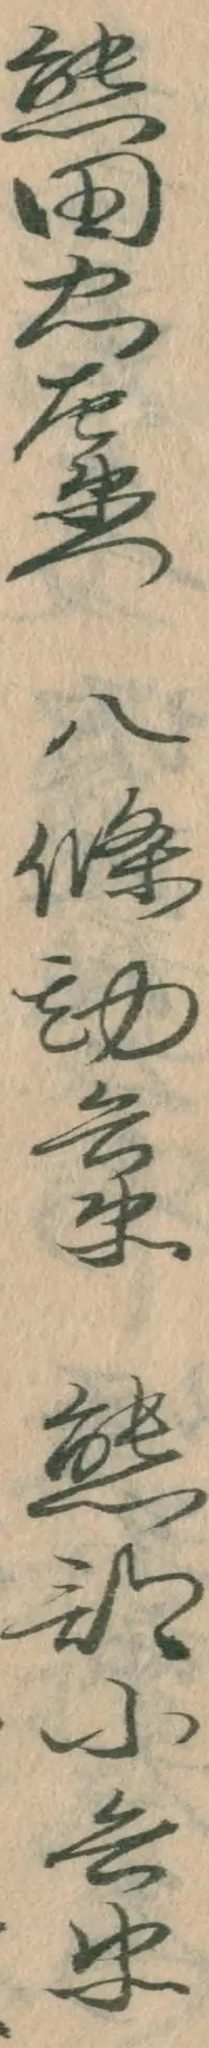熊田忠左衛門八條勘兵衛熊部小兵衛
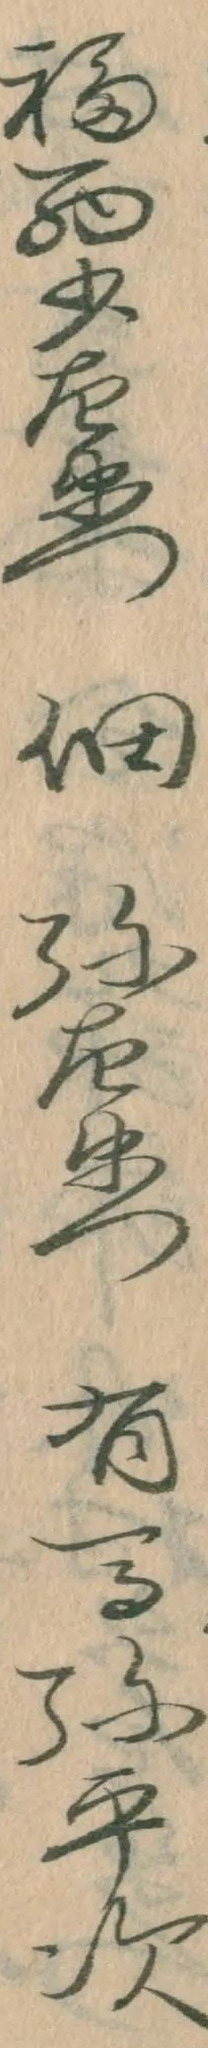福西少左衛門佃弥左衛門有馬弥平次
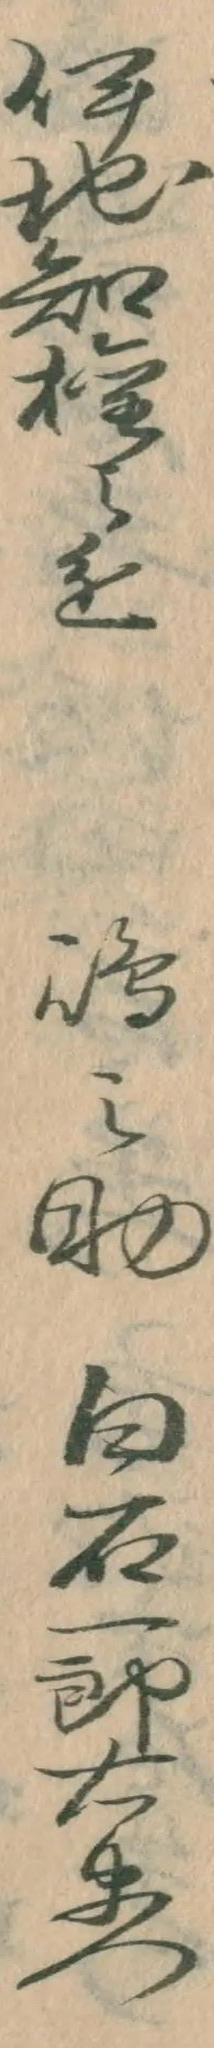伊地知権之進島之助白石一郎右衛門
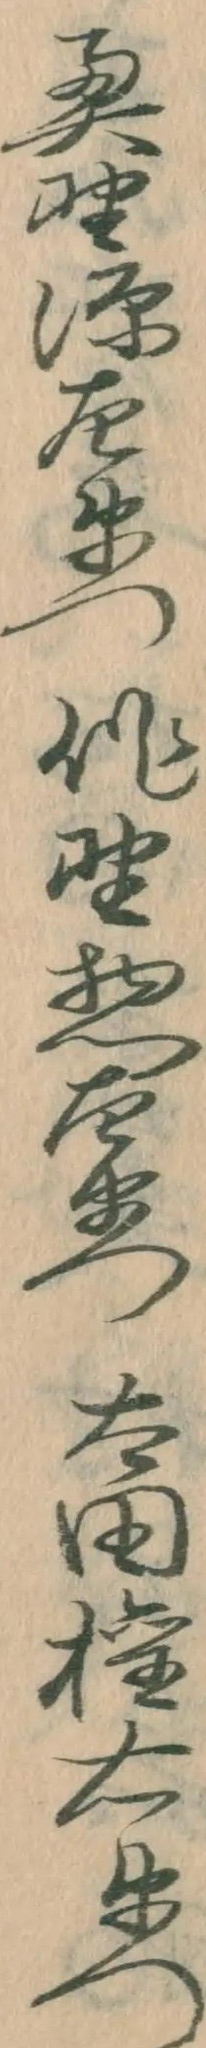奥野源左衛門作野葬惣左衛門太田権右衛門

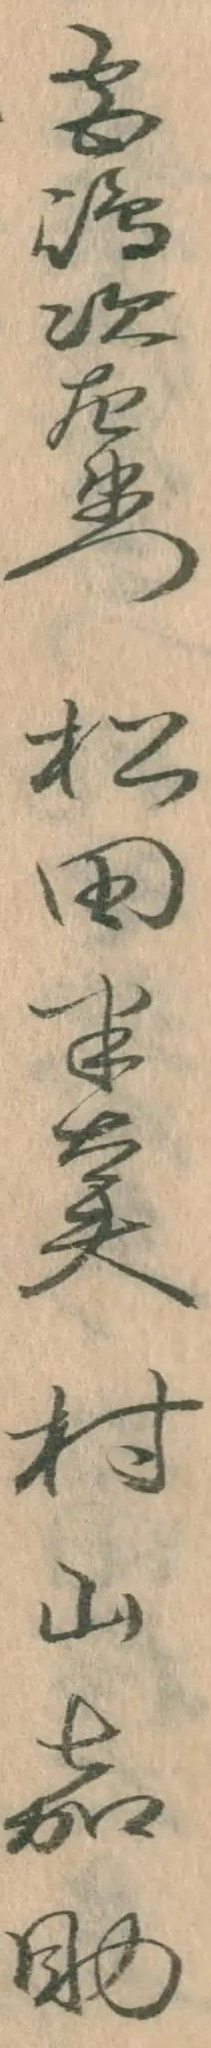宮島次左衛門松田半太夫村山嘉助
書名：切支丹御退治記 49巻. [9]
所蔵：国立国会図書館 National Diet Library, JAPAN
